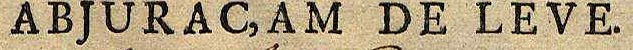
ABJURAÇAM DE LEVE.
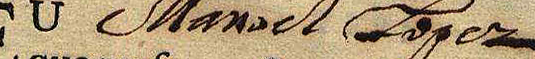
EU Manoel Lopez
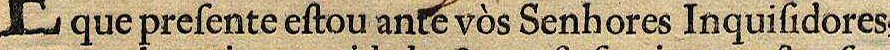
que presente estou ante vòs Senhores Inquisidores,
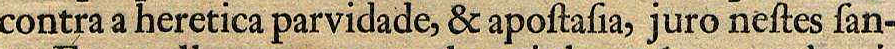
contra a heretica parvidade, & apostasia, juro nestes san
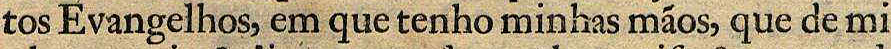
tos Evangelhos, em que tenho minhas mãos, que de mi
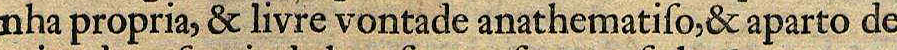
nha propria, & livre vontade anathematiso, & aparto de
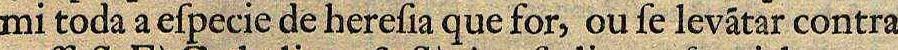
mi toda a especie de heresia que for, ou se levātar contra
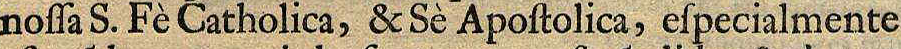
nossa S. Fè Catholica, & Sè Apostolica, especialmente
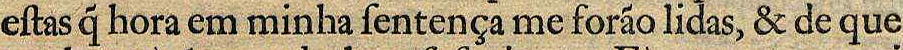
estas q̄ hora em minha sentença me forão lidas, & de que
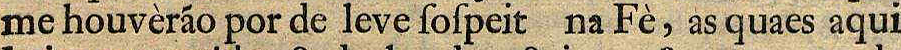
me houverão por de leve sospeit na Fè, as quaes aqui
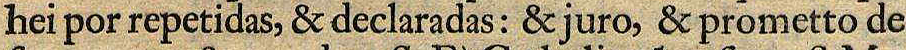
hei por repetidas, & declaradas: & juro, & prometto de
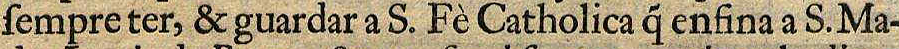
sempre ter, & guardar a S. Fè Catholica q̄ ensina a S. Ma
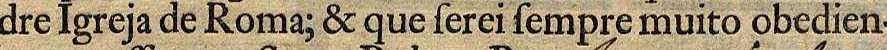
dre Igreja de Roma; & que serei sempre muito obedien
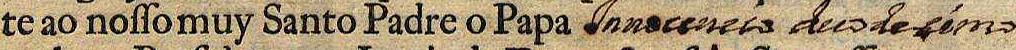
te ao nosso muy Santo Padre o Papa Innocencio duodecimo
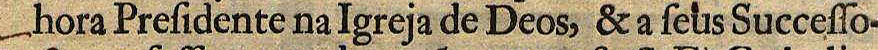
hora Presidente na Igreja de Deos, & a seus Successo
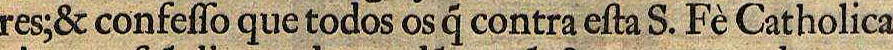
res; & confesso que todos os q̄ contra esta S. Fè Catholica
